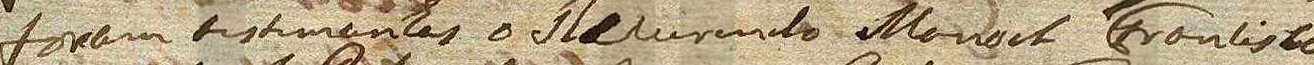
foram testemunhas o Reuerendo Manoel Francisco
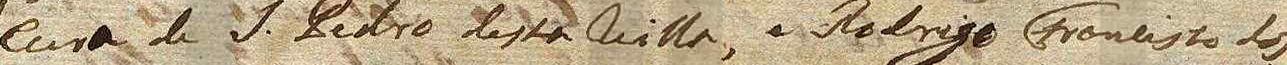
Cura de S. Pedro desta Villa, e Rodrigo Francisco dos
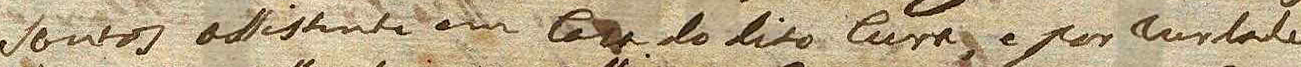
Santos assistente em Caza do dito Cura, e por verdade
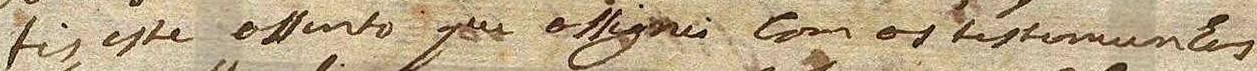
fis este assento que assignei Com as testemunhas.
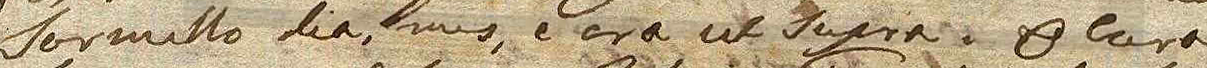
Iermello dia, mes, e era ut supra. O Cura
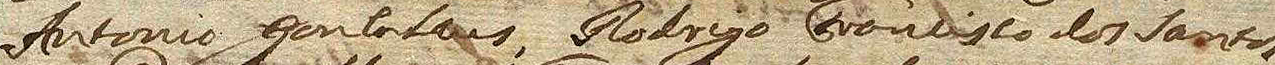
Antonio Goncalves, Rodrigo Francisco dos Santos,
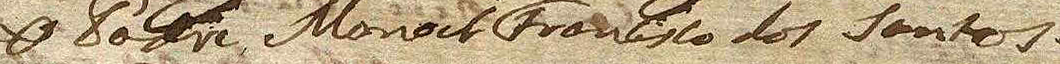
O Padre Manoel FranCisco dos Santos.
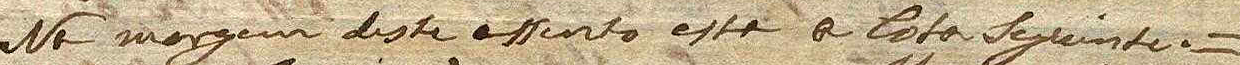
Na margem deste assento esta a Cota seguinte. =
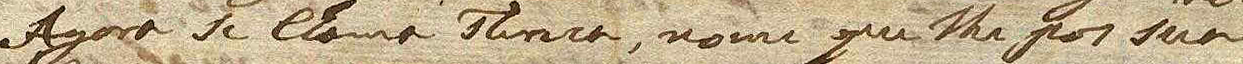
Agora se Chama Thereza, nome que lhe pos sua
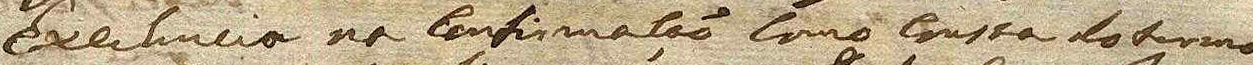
Exelencia na Confirmaçaõ Como Consta do termo
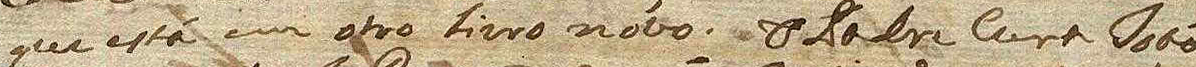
que está em otro Livro novo. O Padre Cura Ioaõ
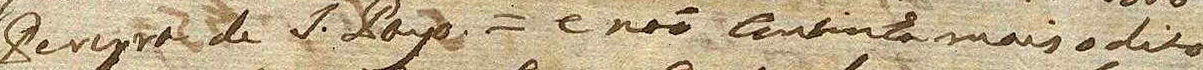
Pereyra de S. Payo. = e naõ continha mais o dito
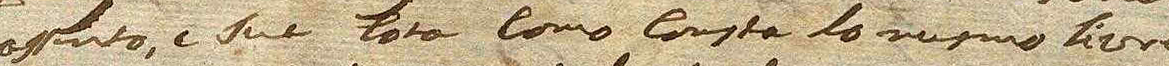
assento, e sua cota Como Consta do mesmo Livro
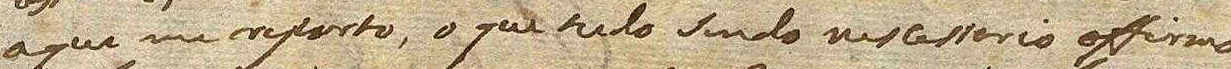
a que me reporto, o que tudo sendo nescessario affirmo
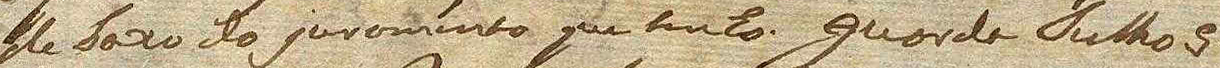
debaxo do juramento que tenho. Guarda Iulho 5.
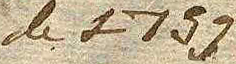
de 1759.
